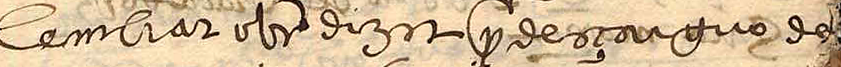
lembrar o vē dizer p̄o descarguo de
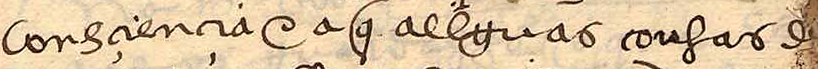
consçiençia e a q̄ allguās cousas l_
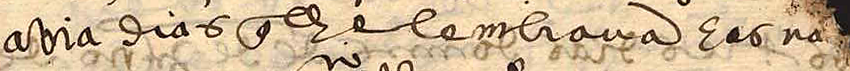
avia dias q̄ lhe lembraua E as na_
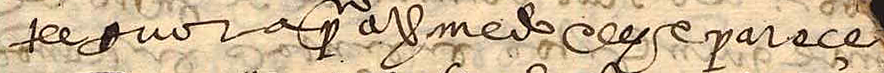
tee guora p̄o aꝟ medo e lhe pareçe
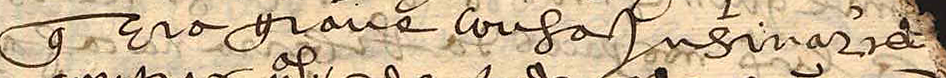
q̄ Era graue cousa Jnsinar e_
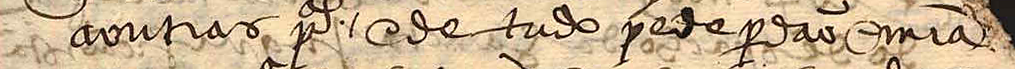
a outras pas. / e de tudo pede ꝑdaõ e mīa
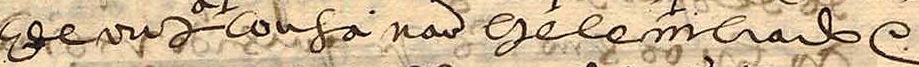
E de outa cousa naõ he lembrado e
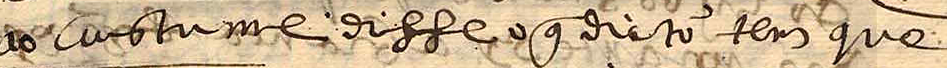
ao custume disse o que dictō tem que
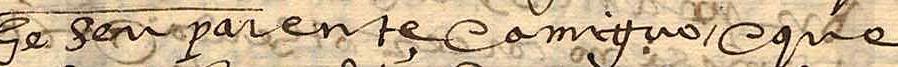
he seu parente, e amiguo / e que
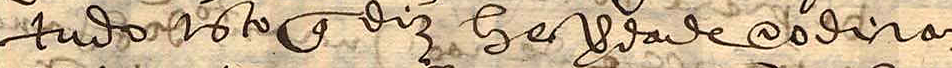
tudo isto q̄ diz he ꝟdade e o dira
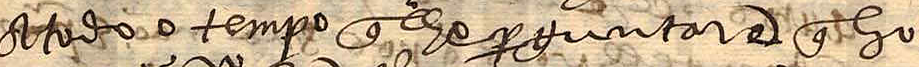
A todo o tempo q̄ lhe ꝑ guntarē q̄ ho
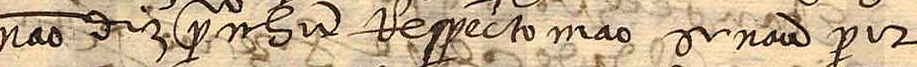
naõ diz̄ ꝑo nhū Respecto mao se naõ por
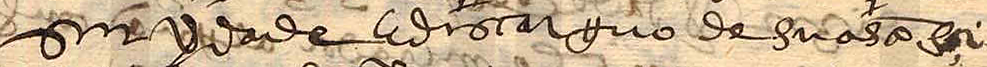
ser ꝟdade E descarguo de suas cōsçi
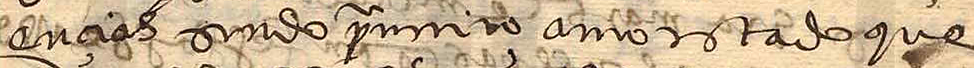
ençias sendo p̄meiro amoestado que
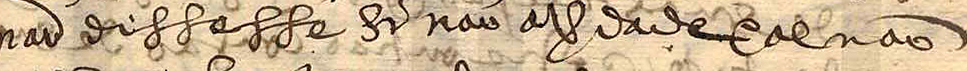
naõ dissesse senaõ a ꝟdade e al naõ
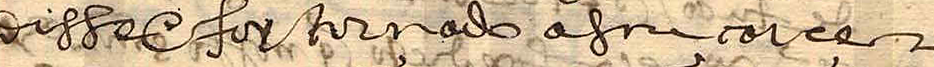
disse e foy tornado a seu carçer
